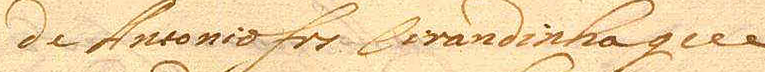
de Antonio frs Cirandinha que
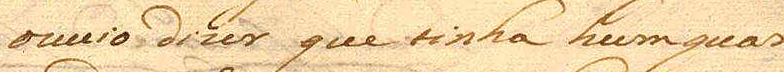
ouuio dizer que tinha hum quar
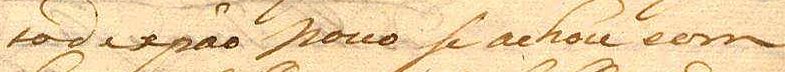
to de xpão nouo se achou com
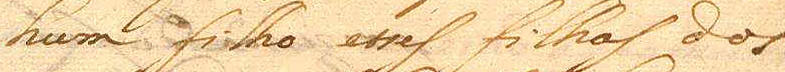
hum filho e tres filhas dos
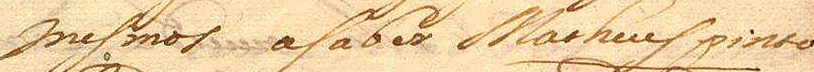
mesmos a saber Matheus pinto
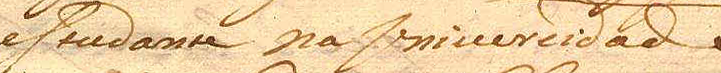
estudante na Vniuercidade
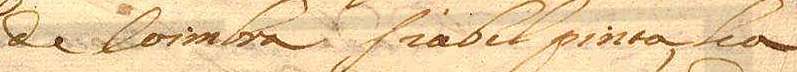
de Coimbra Jzabel pinta, Lea
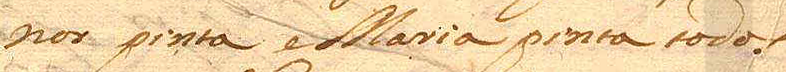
nor pinta e Maria pinta todos
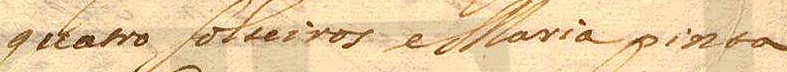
quatro solteiros e Maria pinta
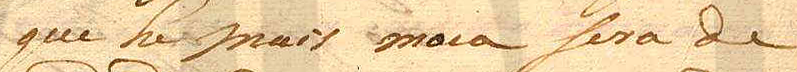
que he mais moca sera de
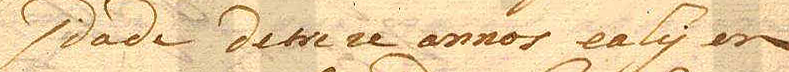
jdade de treze annos e ahy en
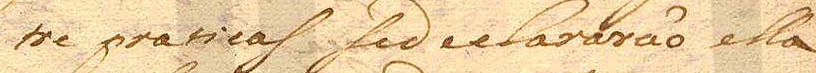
tre praticas se declararaõ ella
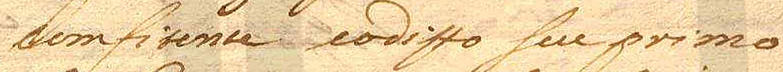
comfitente e o ditto seu primo
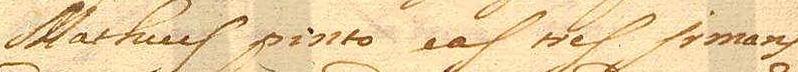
Matheus pinto e as tres jrmans
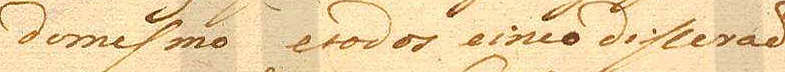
do mesmo e todos cinco disseraõ
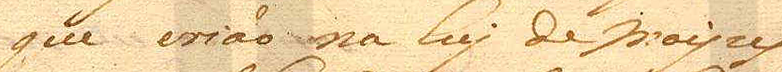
que criaõ na ley de moyzes
